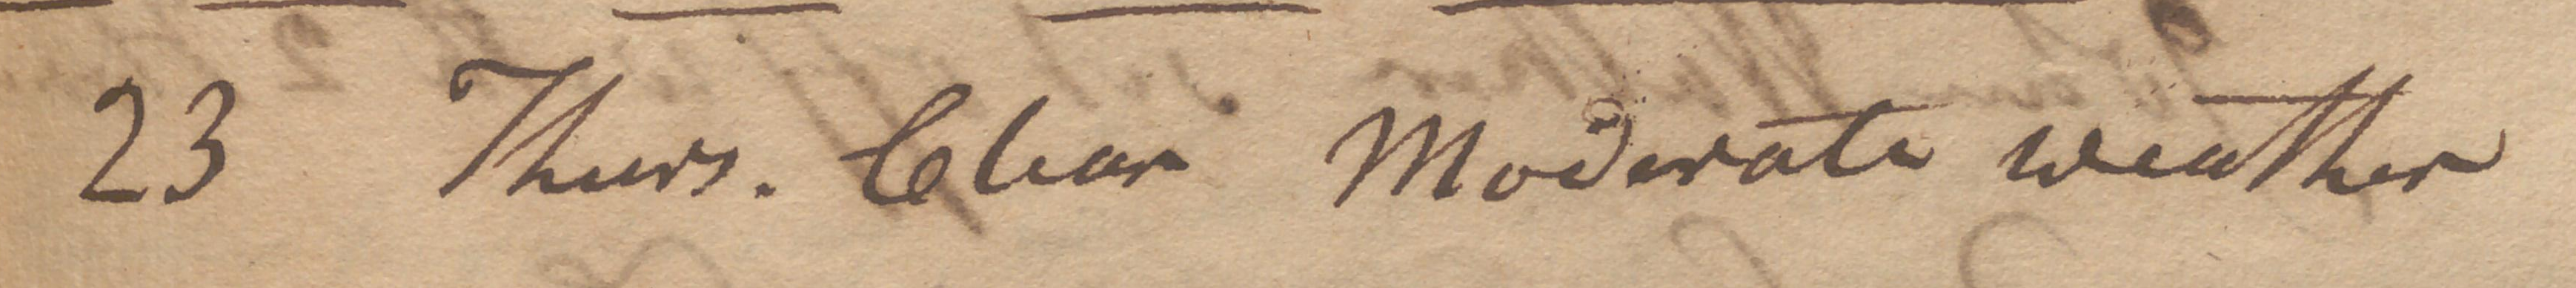23 Thurs. Clear Moderate weather
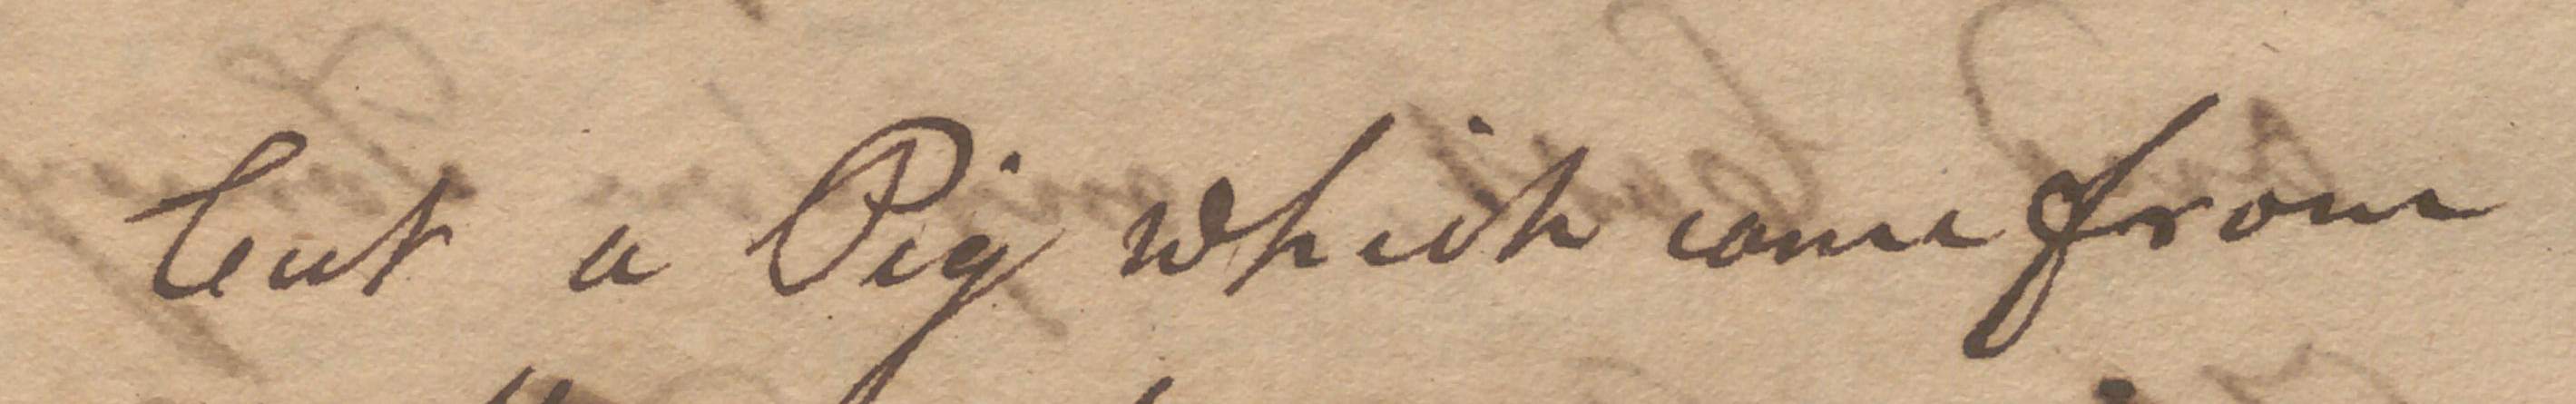Cut a Pig which came from
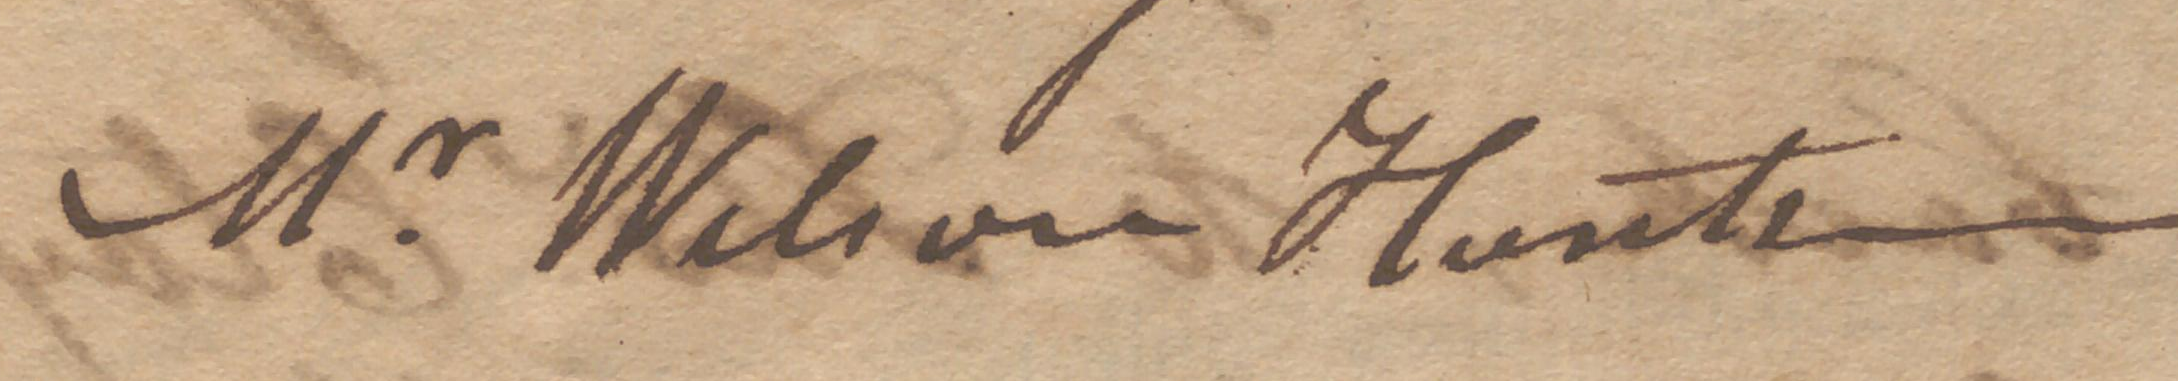M^r. Wilson Hunts
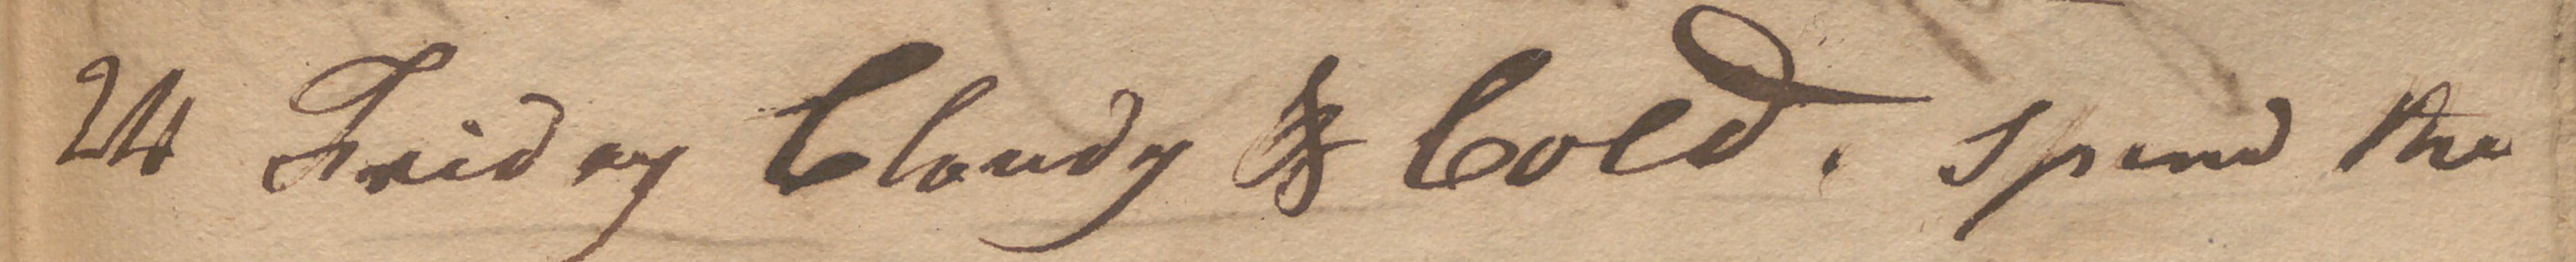24 Friday Cloudy & Cold. spend the
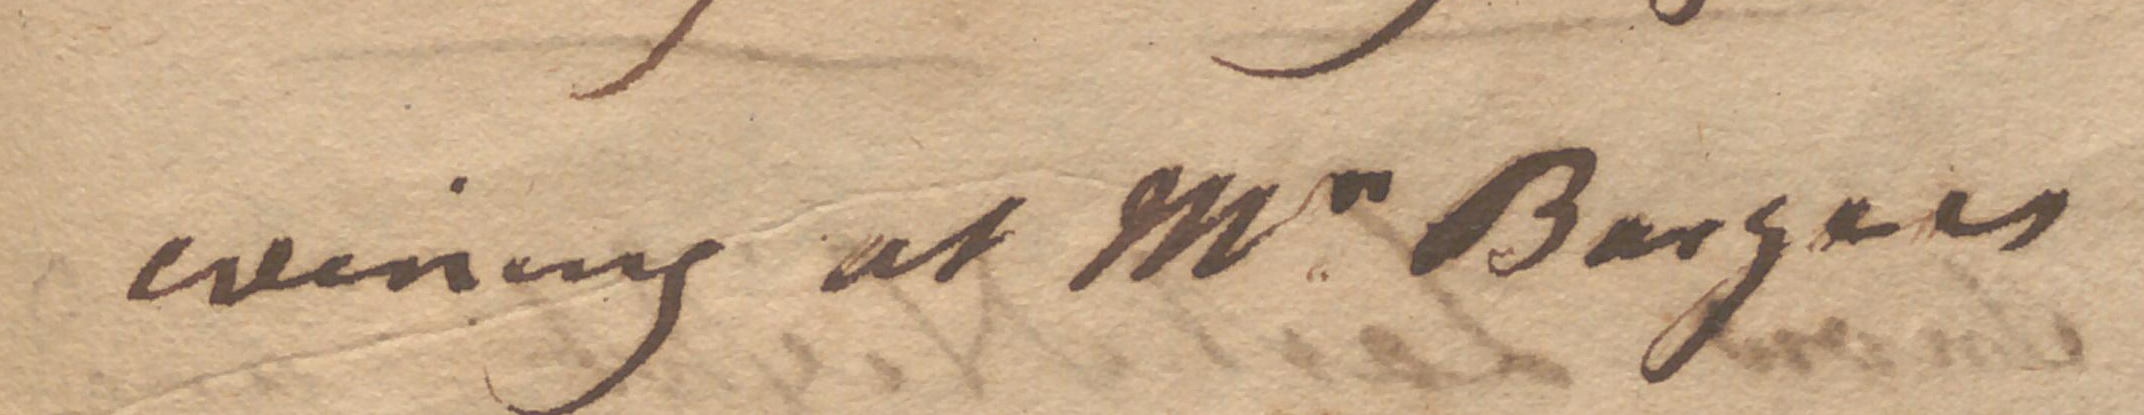evinig at M^r. Bargees
